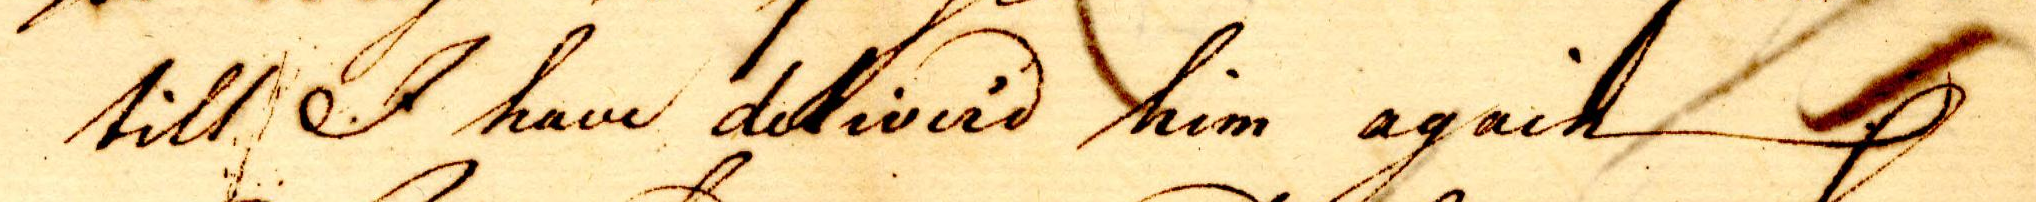till I have deliver'd him again.
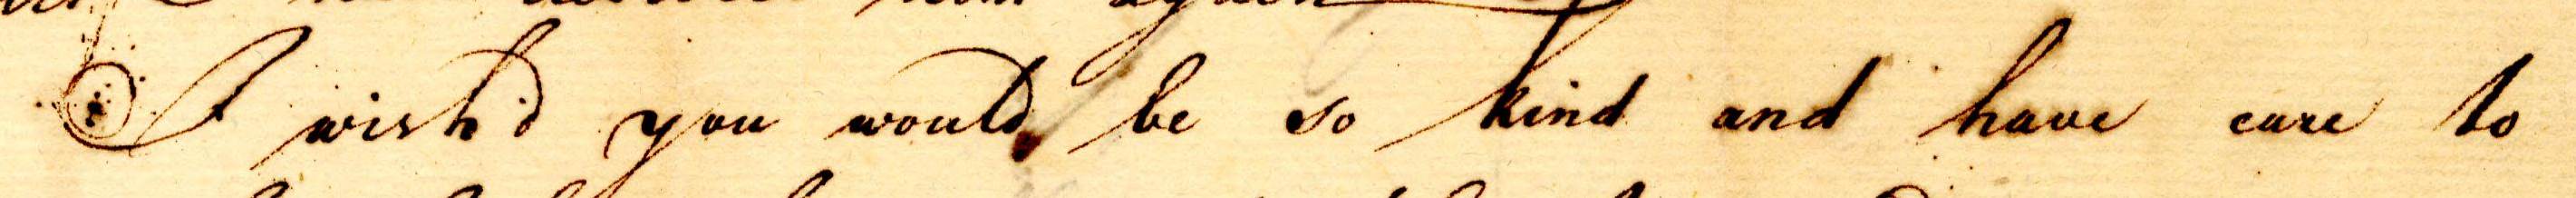I wish you would be so kind and have care to
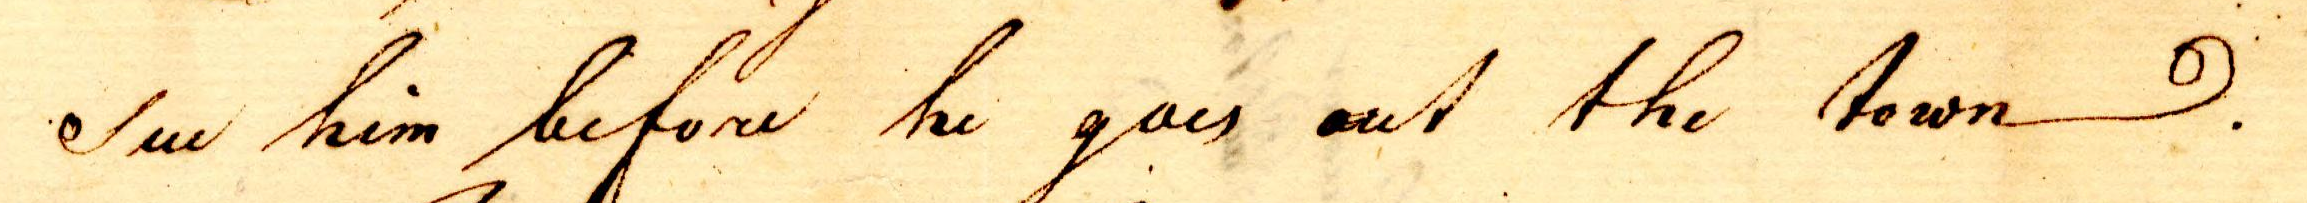sue him before he goes out the Town.
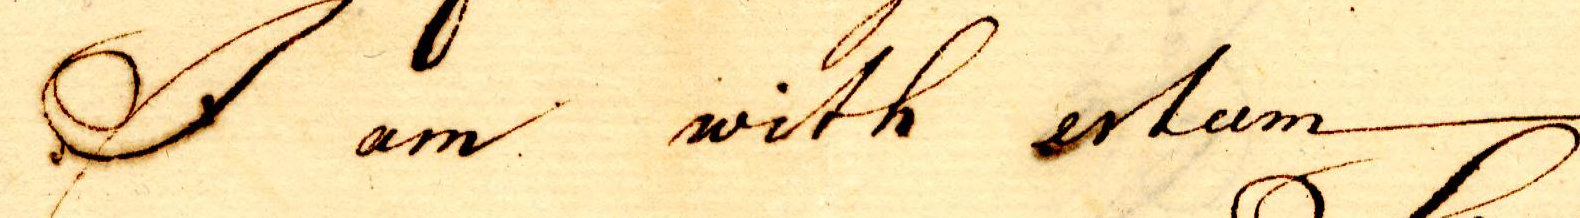I am with esteem.
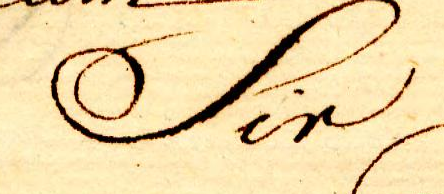Sir
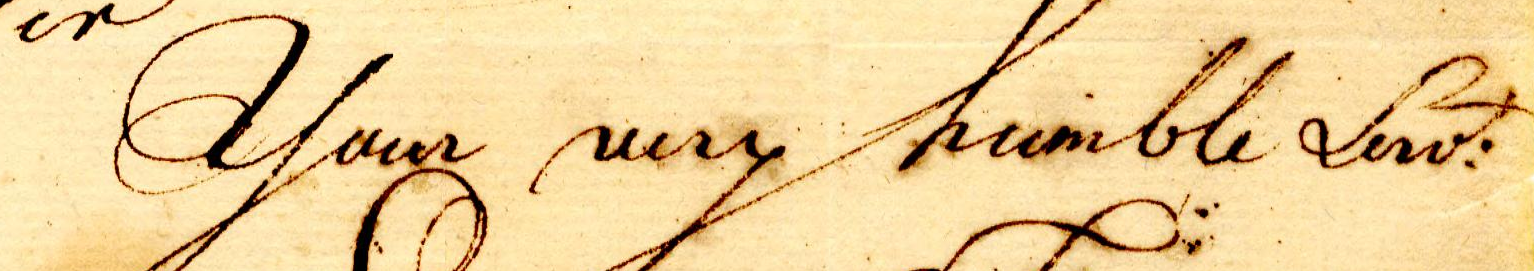Your very humble Serv^t
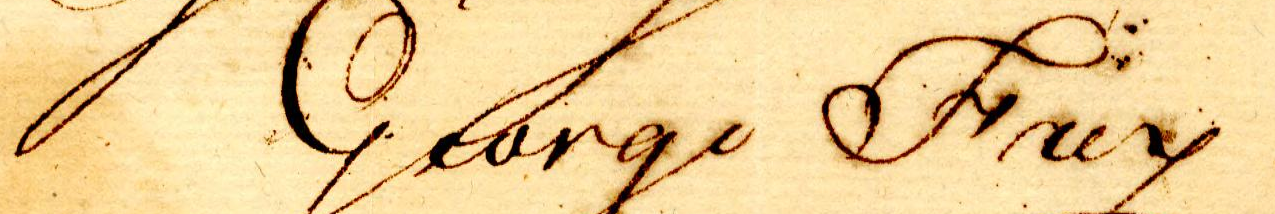George Frey
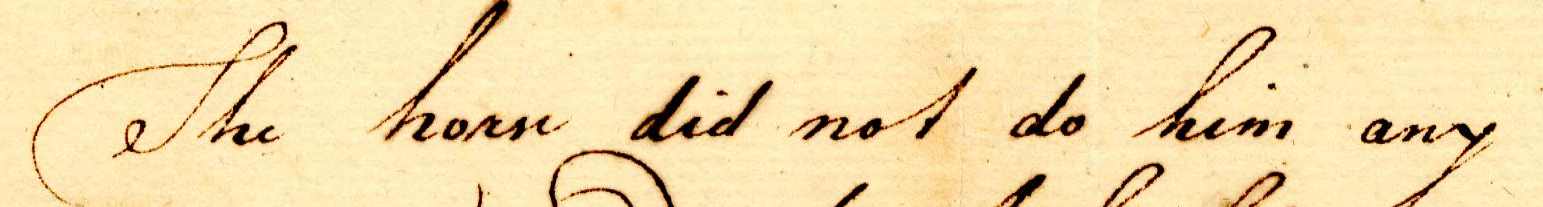The horn did not do him any
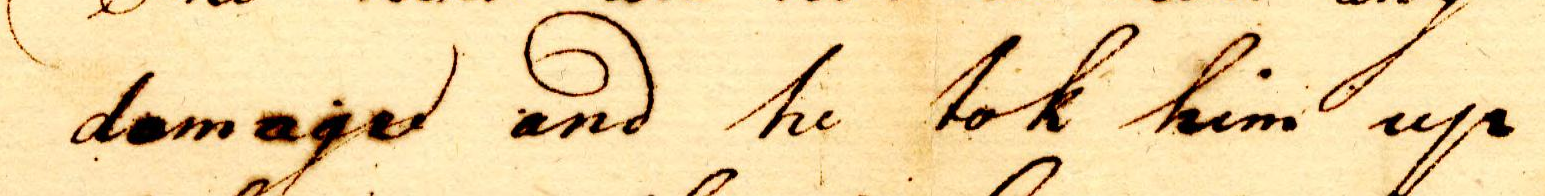damage and he tok him up
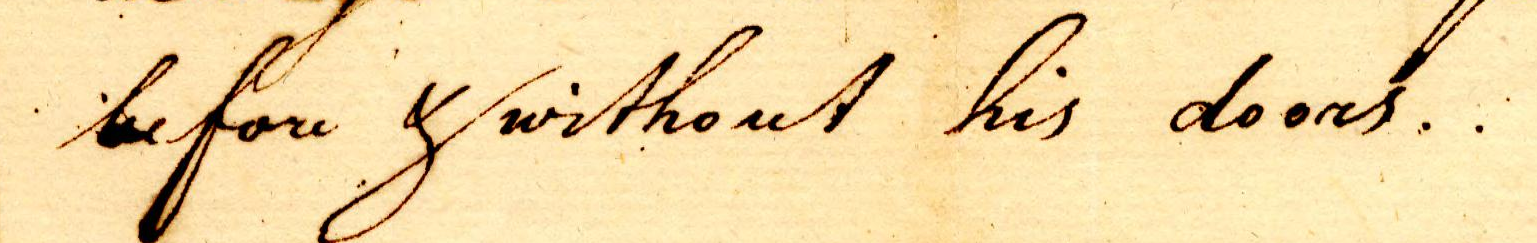before & without his doors.
